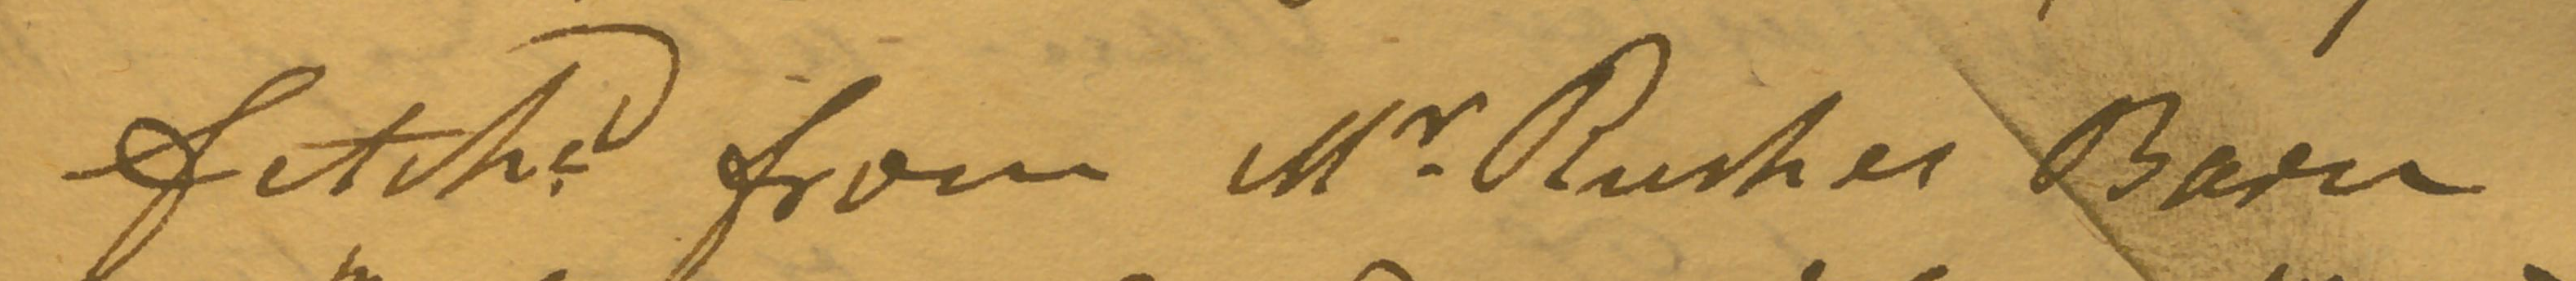fetch^d. from M^r. Rushes Barn
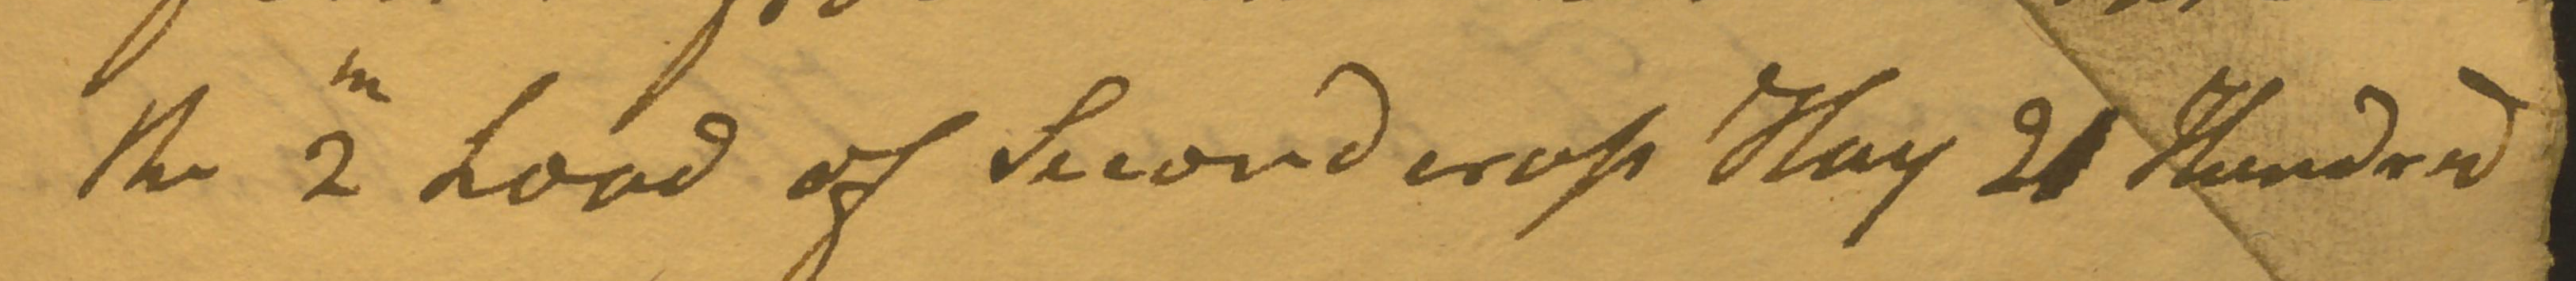the 2^th Load of second crop Hay 21 Hundred
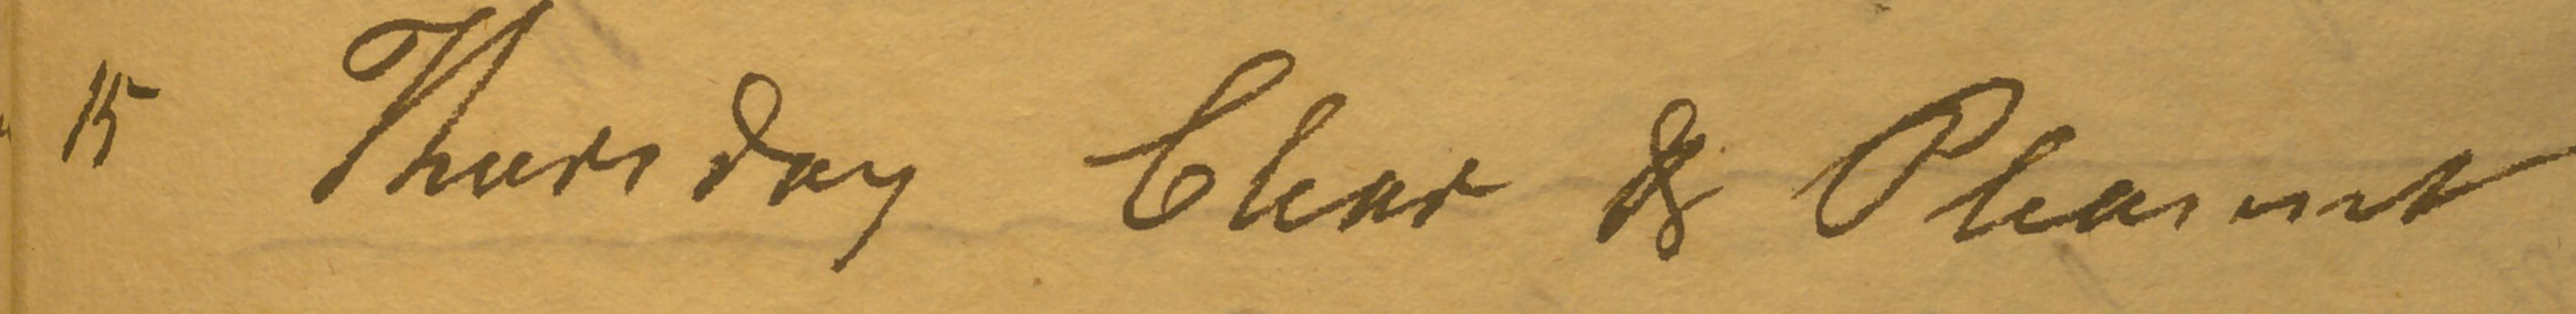15 Thursday Clear & Pleasent
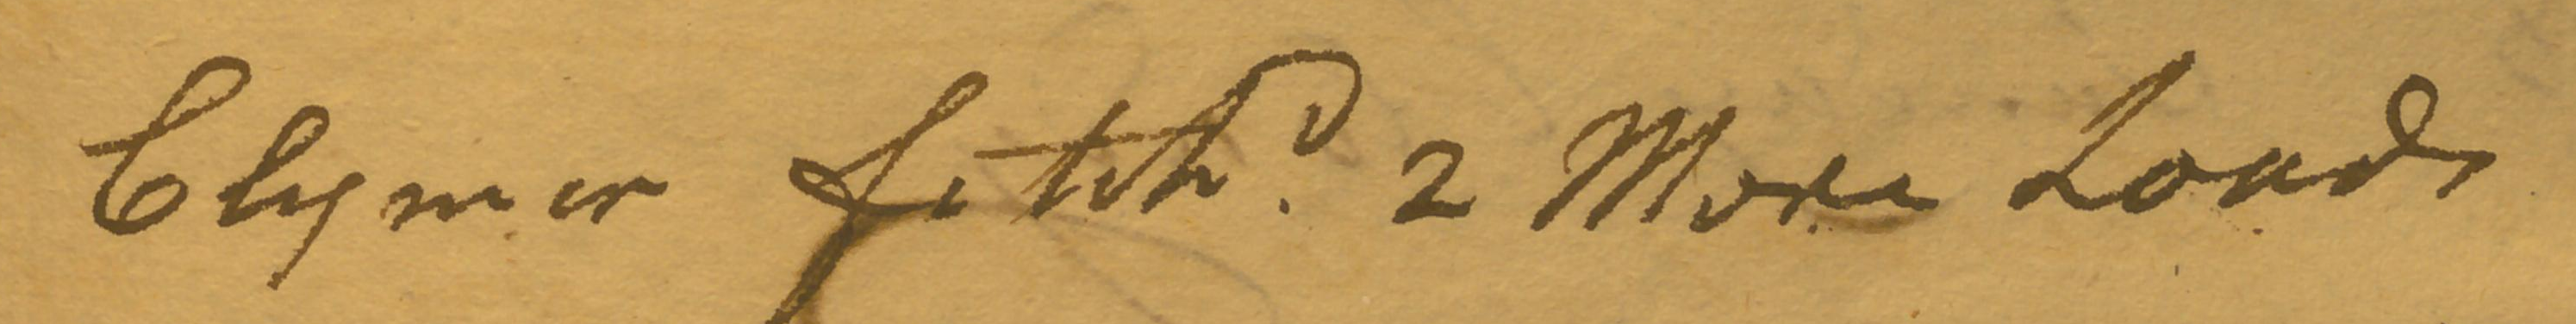Clymer fetch^d. 2 More Loads
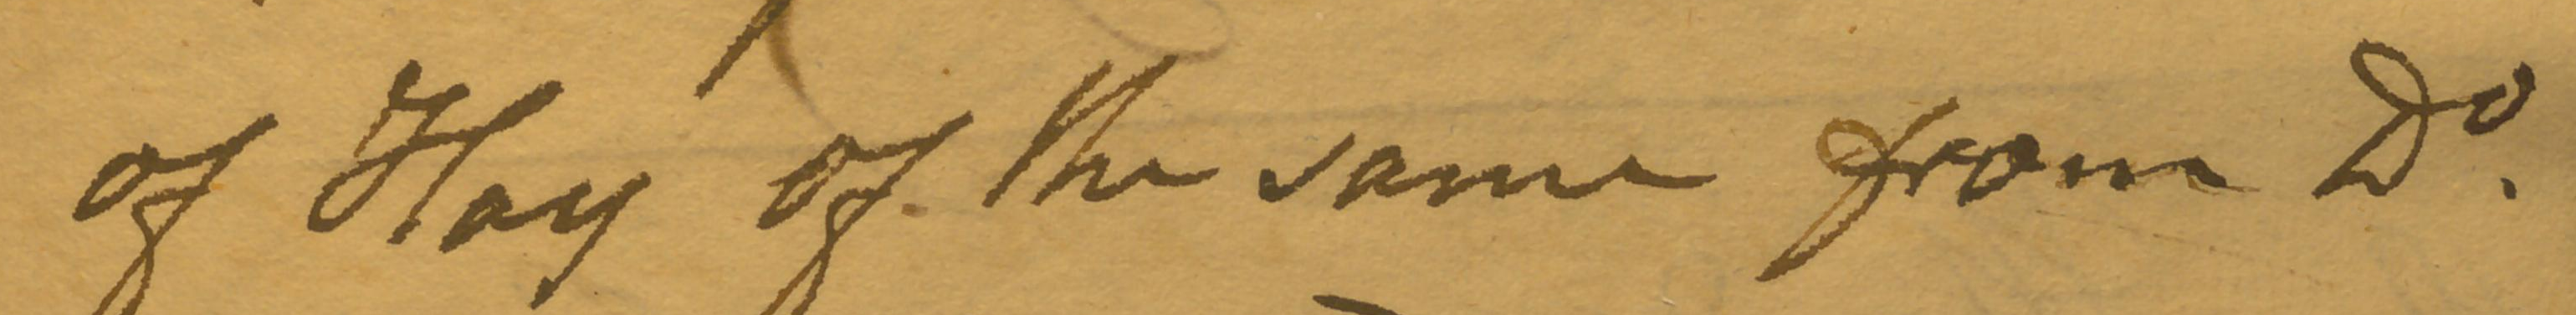of Hay of the same from D^o.
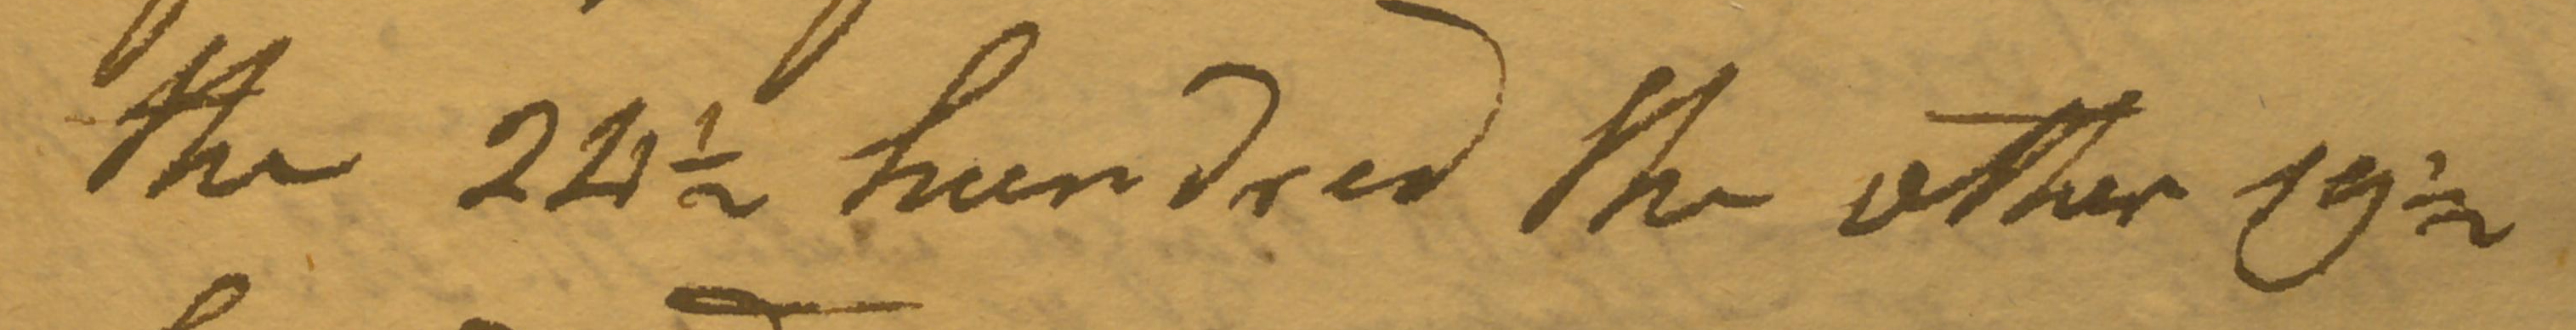the 24 1/2 hundred the other 19 1/2
